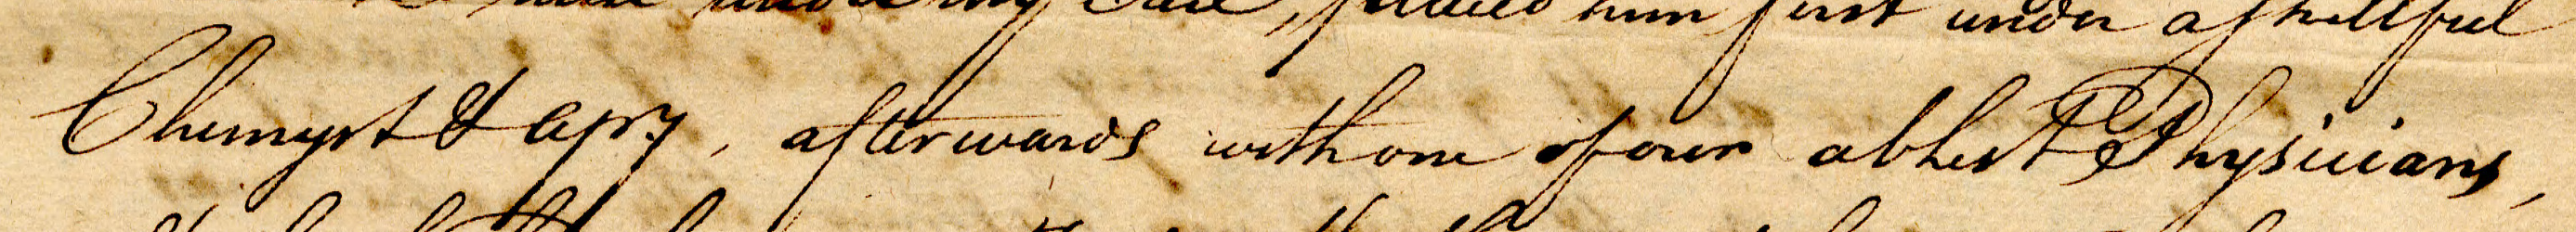Chymist & ap.y, afterwards with one of our ablest Physicians,
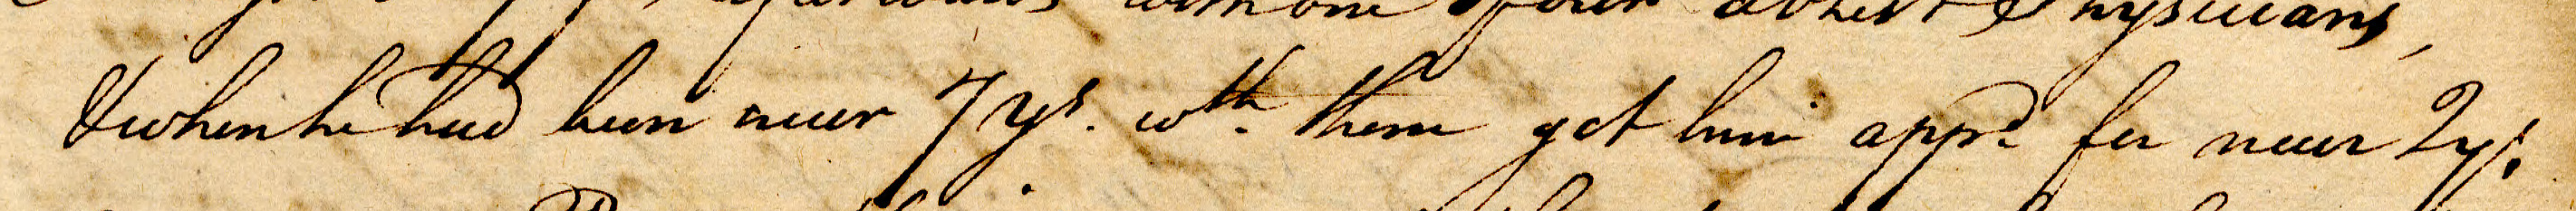& when he had been over 7 y^s. w^th. them got him app^d. for near 2 y^s.
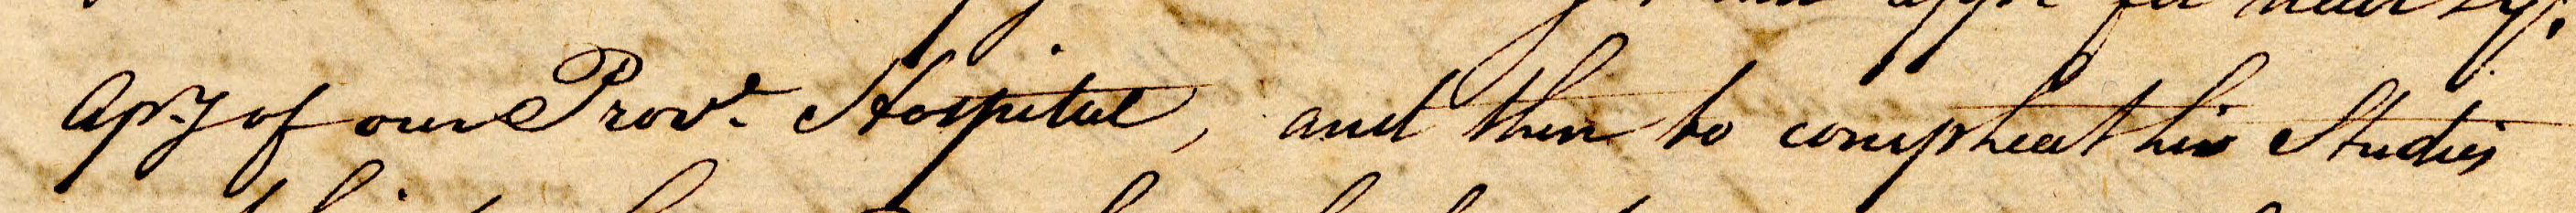ap.y of our Prov^l. Hospital, and then to compleat his Studies
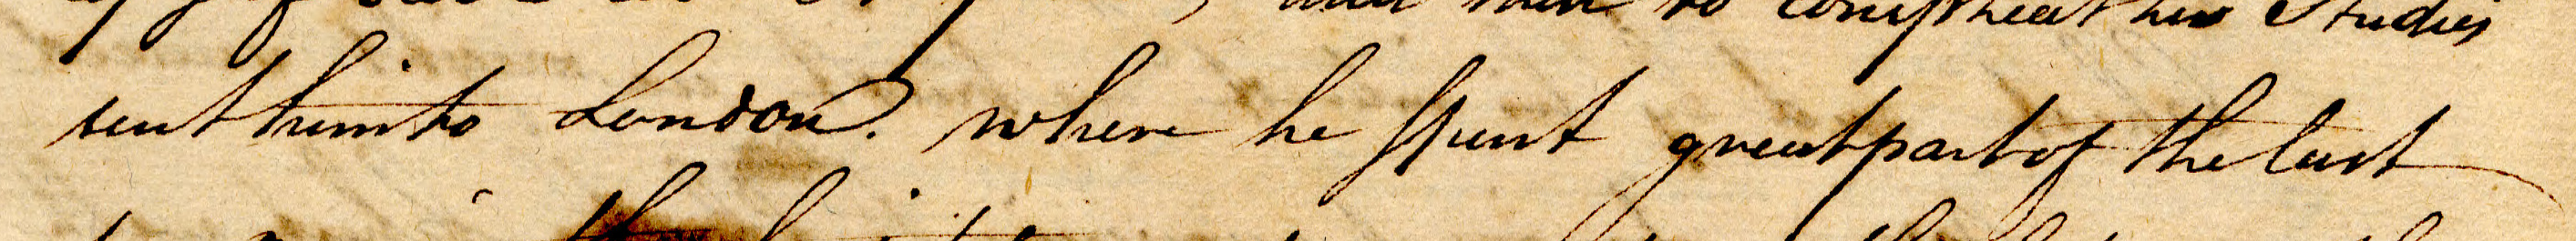sent him to London where he spent great part of the last
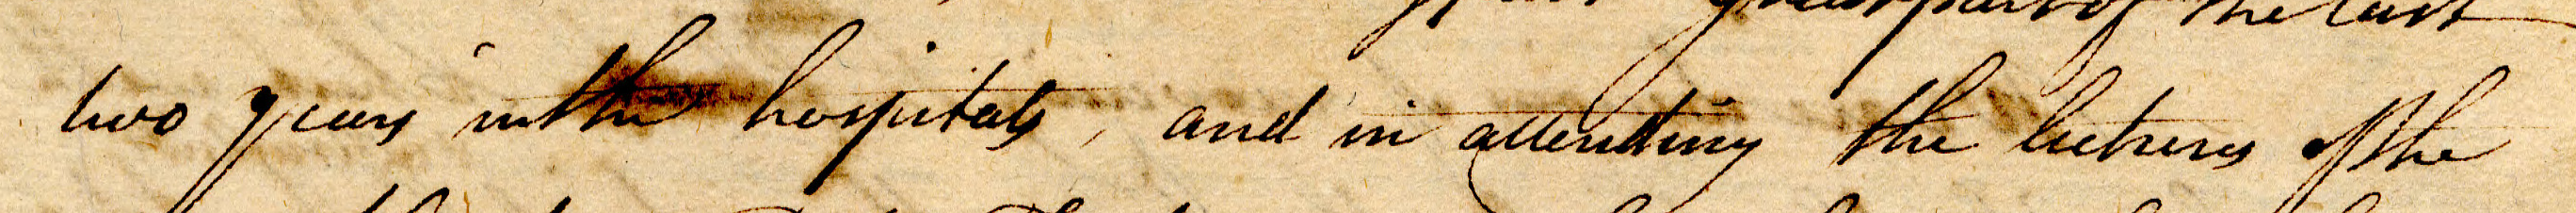two years in the hospitals, and in attending the lectures of the
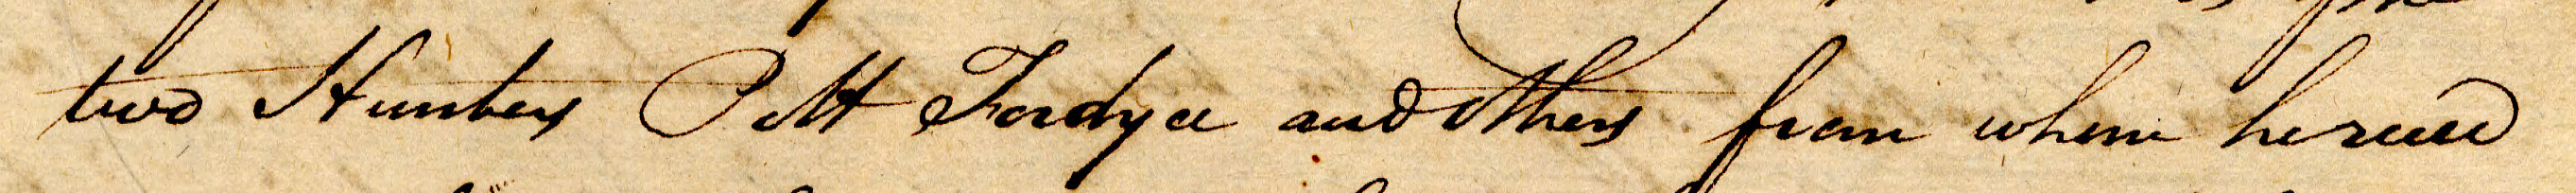two Hunters Pott Fordyce and others from whom he recd
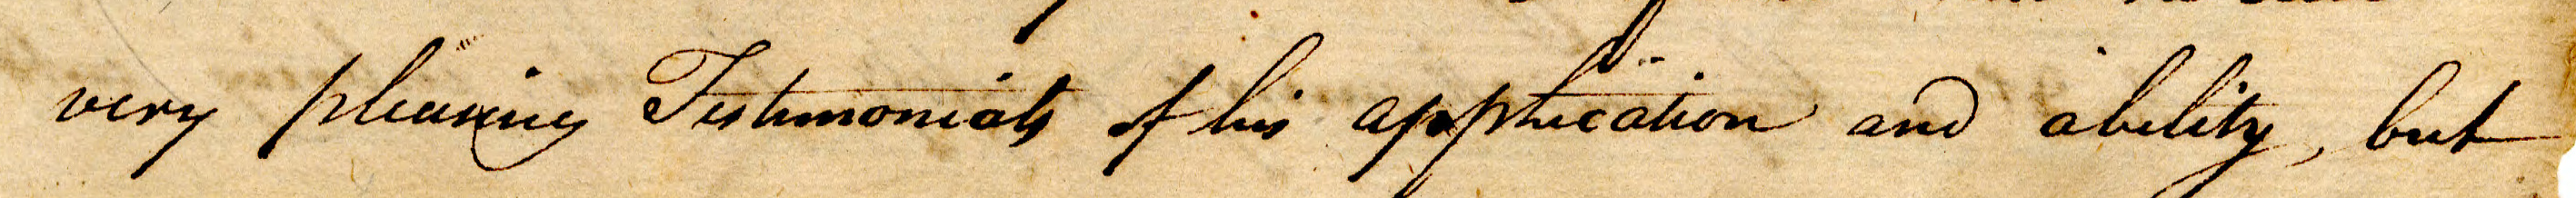very pleasing Testimonials of his application and ability, but
